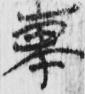東
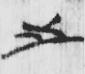之
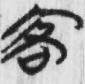客
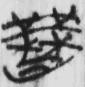○（許）
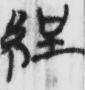○（盈）
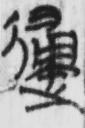歸
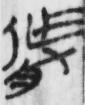胙
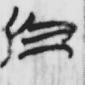於
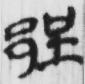郢
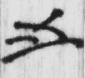之
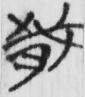歲（歲）
